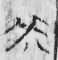癸
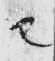巳
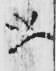之
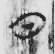日
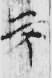不
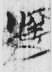𬨭（將）
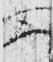五
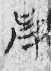皮
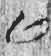㠯（以）
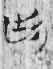○（廷）
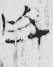阩
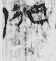門
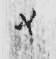又
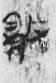敗
